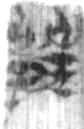兼
